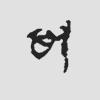旬
